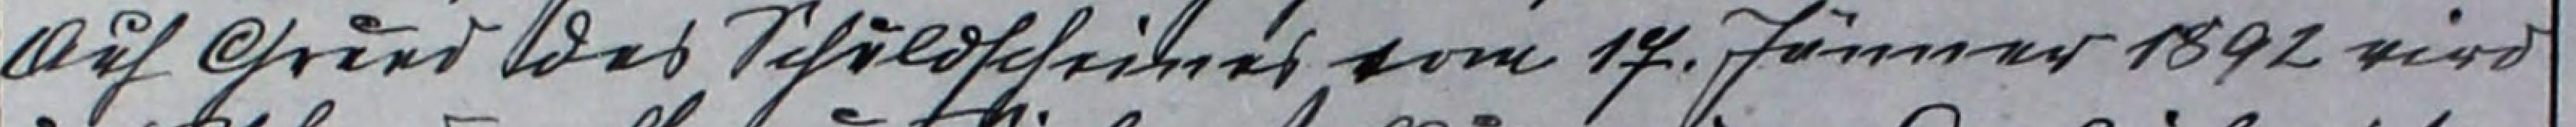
Auf Grund des Schuldscheines vom 17. Jänner 1892 wird
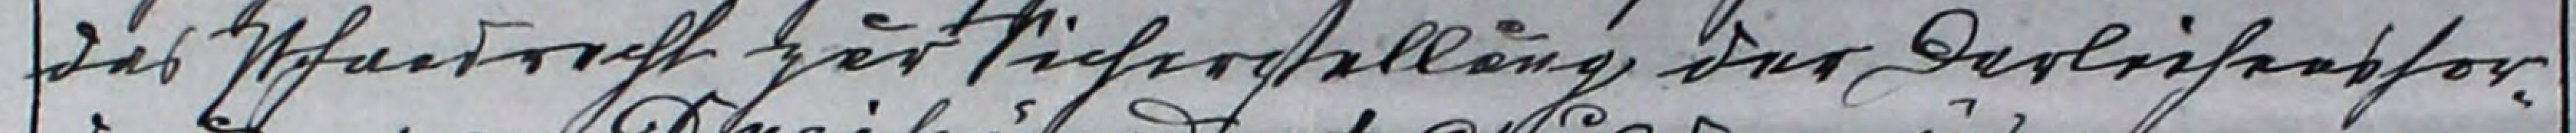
das Pfandrecht zur Sicherstellung der Darleihensfor„
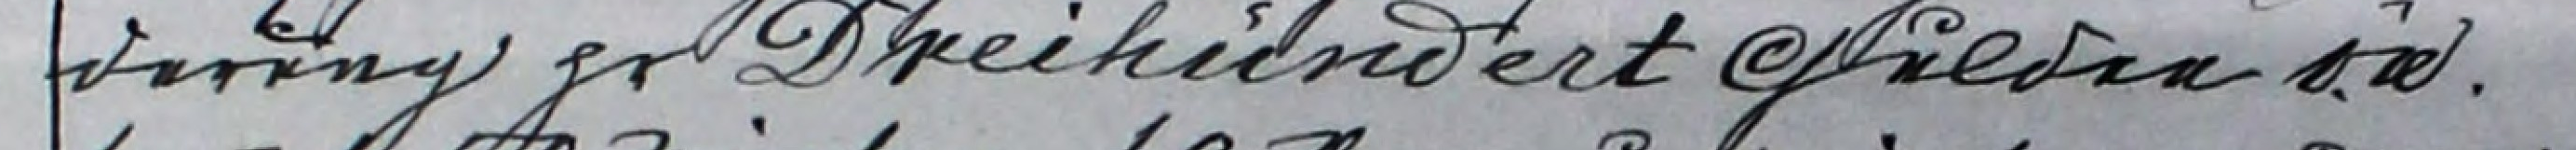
derung pr Dreihundert Gulden ö.k.
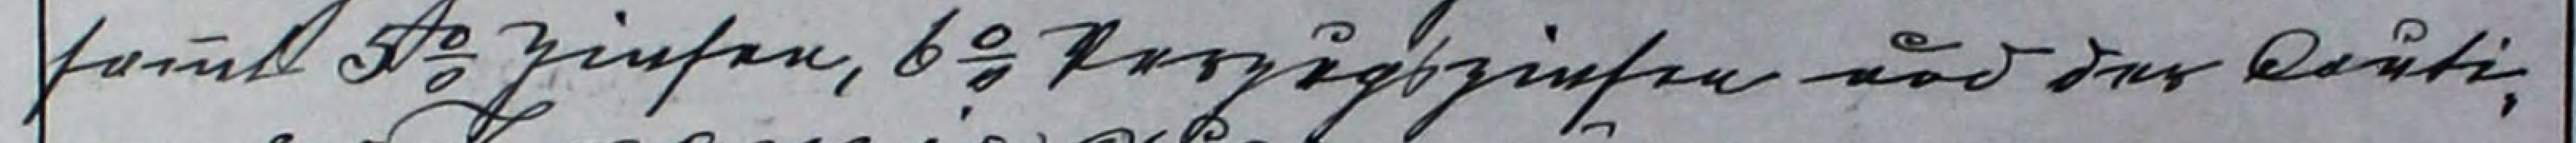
sammt 5% Zinsen, 6% Verzugszinsen und der Kauti„
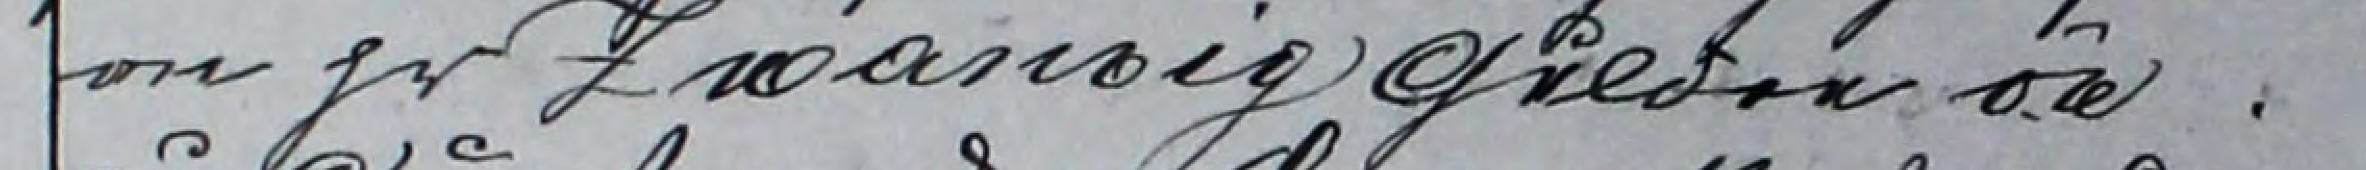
on pr Zwanzig Gulden ö.k
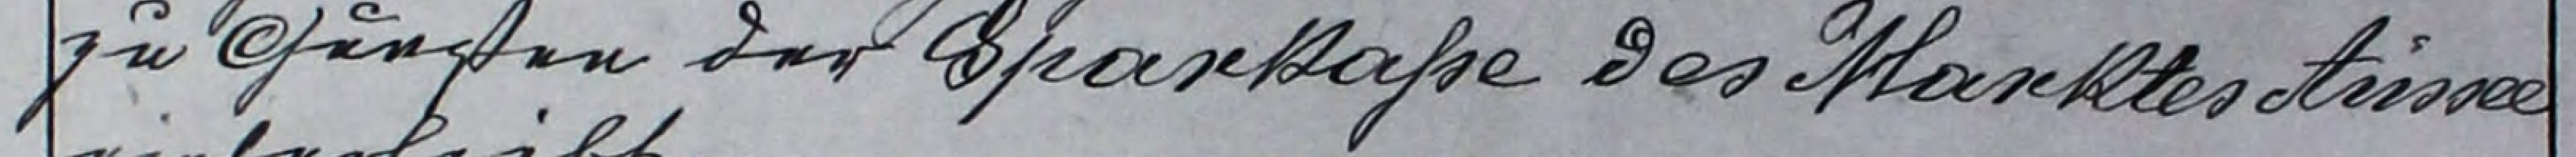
zu Gunsten der Sparkasse des Marktes Aussee
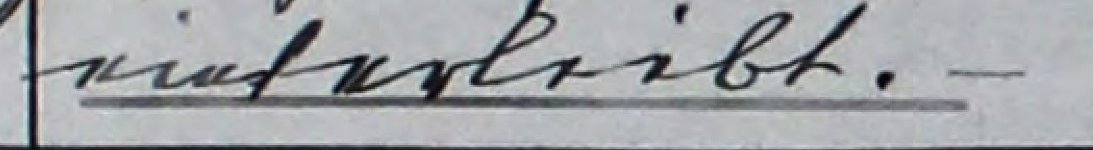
einverleibt.
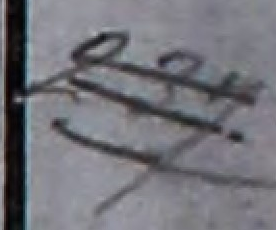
237
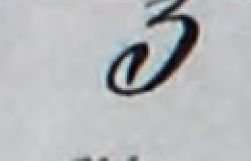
3
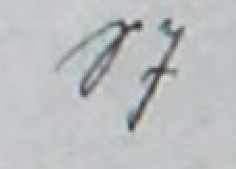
S7
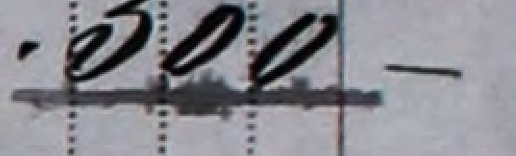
300 -
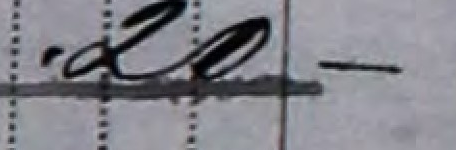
20 -
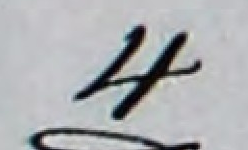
4
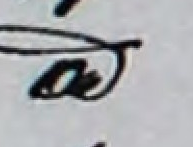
a
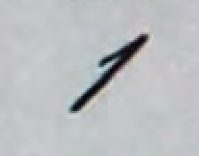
1
